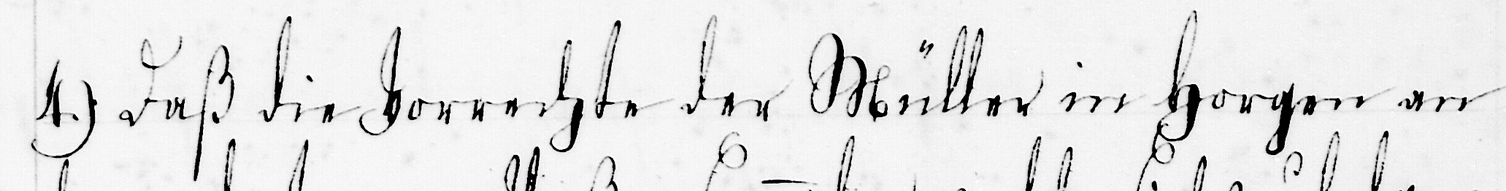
4.) Daß die Vorrechte der Müller in Horgen an
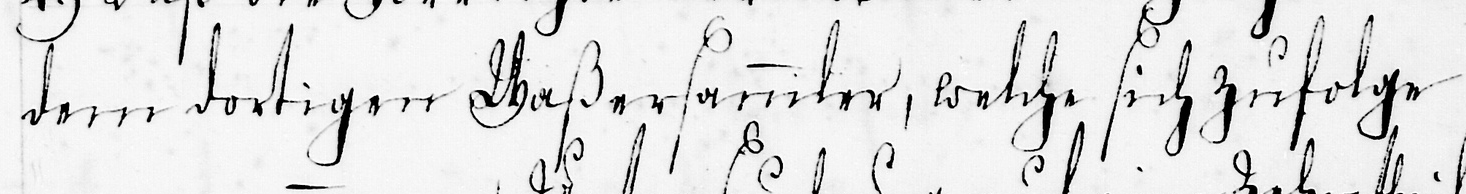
dem dortigen Waßersammler, welche sich zufolge
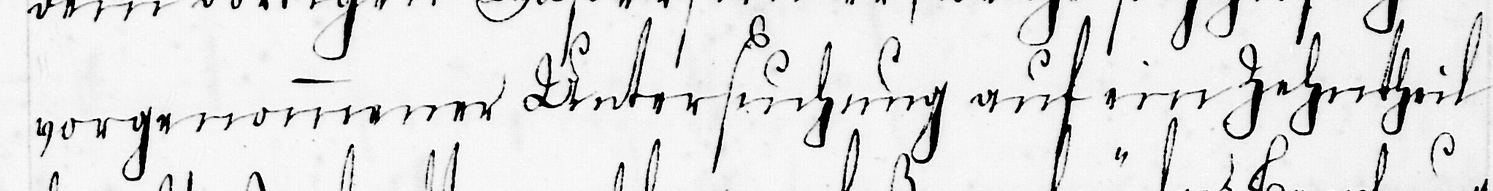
vorgenommener Untersuchung auf ein Zehntheil
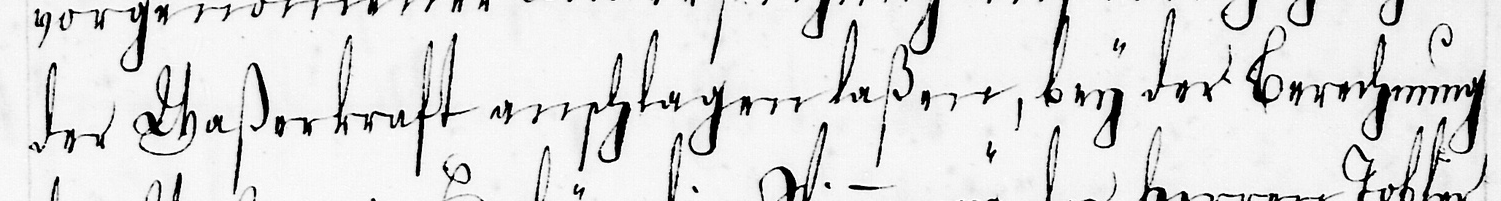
der Waßerkraft anschlagen laßen, bey der Berechnung
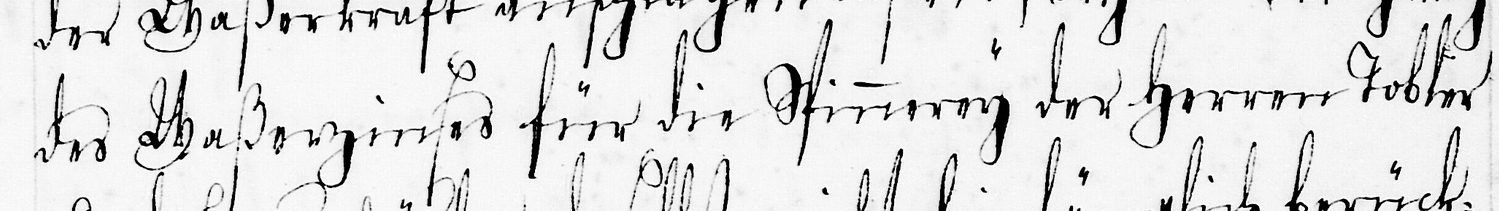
des Waßerzinses für die Spinnerey der Herren Tobler
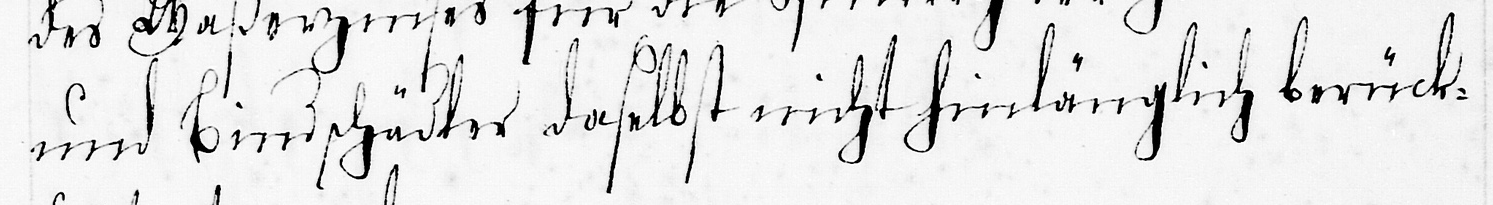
und Bindschädler daselbst nicht hinlänglich berück¬
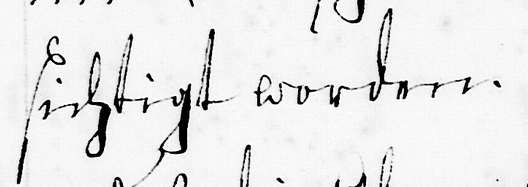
sichtigt worden.
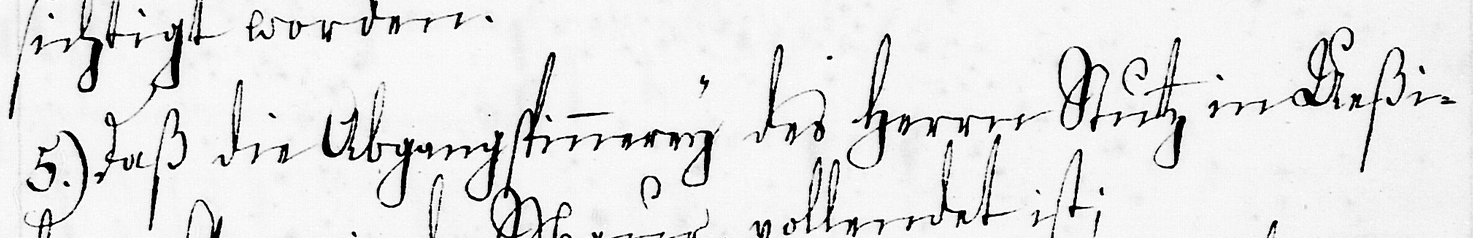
5.) Daß die Abgangspinnerey des Herrn Stutz in Ueßi¬
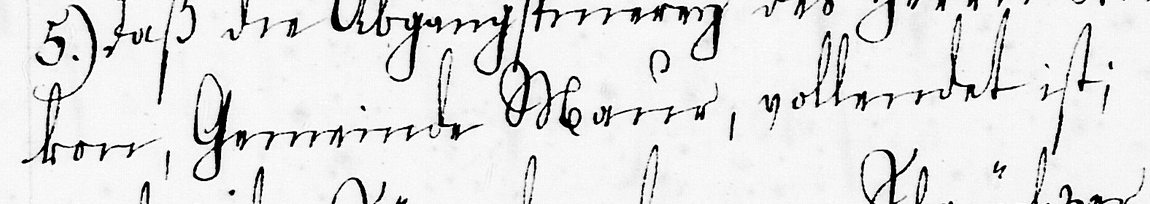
kon, Gemeinde Maur, vollendet ist;
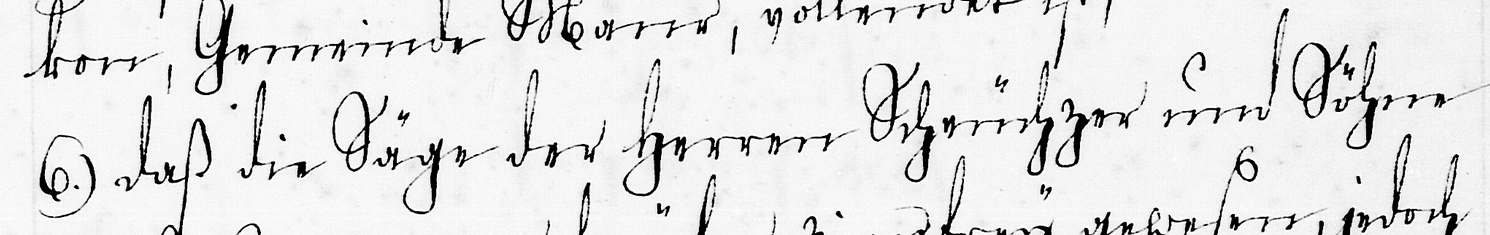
6.) Daß die Säge der Herren Scheuchzer und Söhne
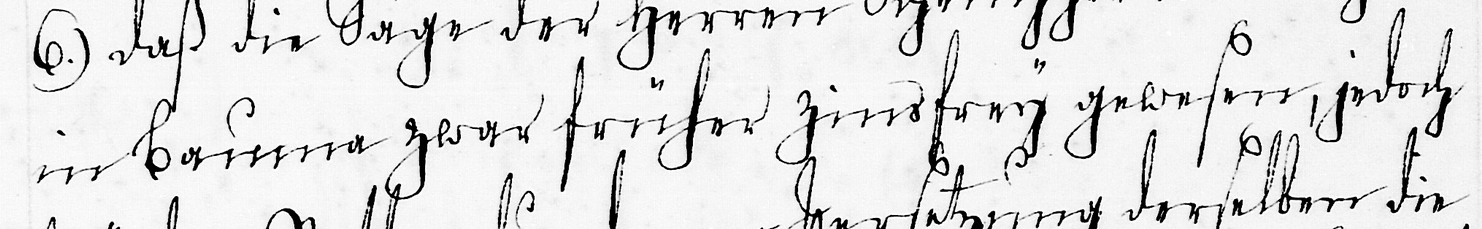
in Bauma zwar früher zinsfrey gewesen, jedoch
